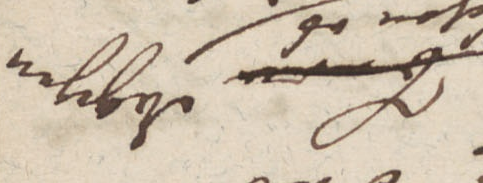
lung fortlaufen.
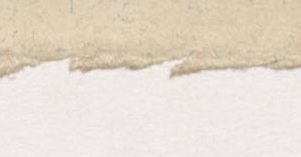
Möbel ist beweglich.
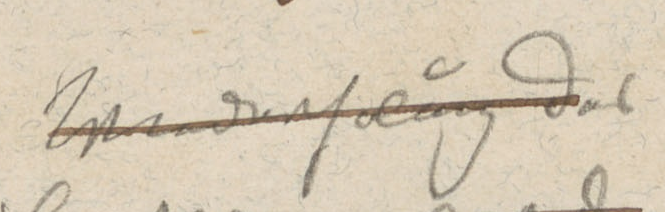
zwar bewegbar darf
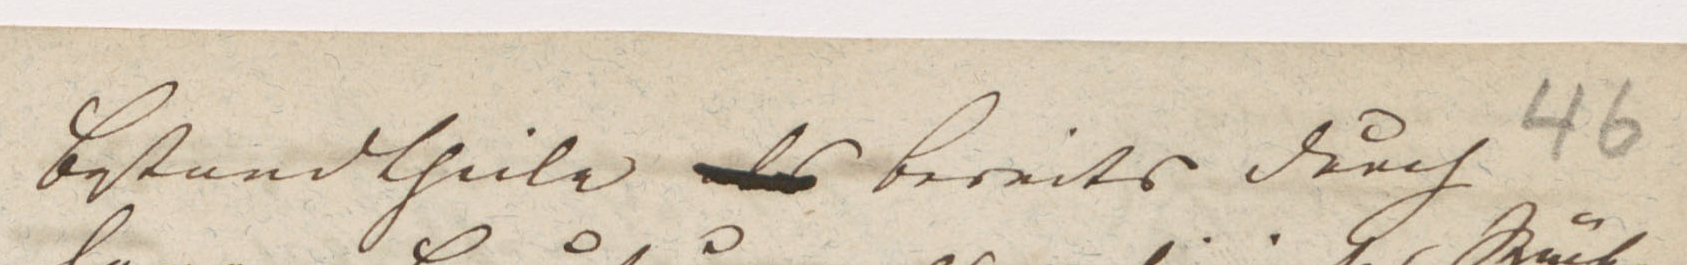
Bestandtheile als bereits durch
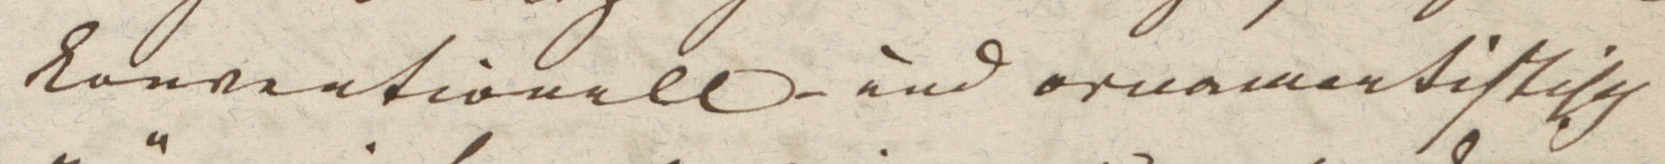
konventionell und ornamentistisch
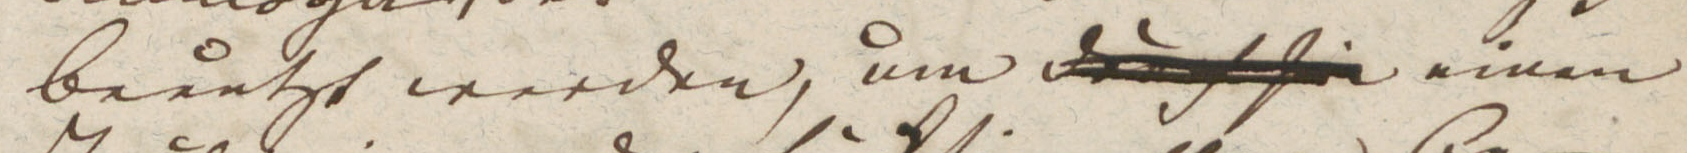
benutzt werden, um durch sie einen
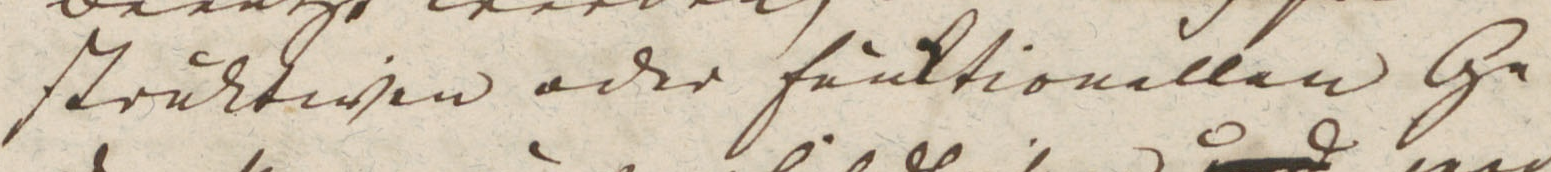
struktiven oder funktionellen Ge-
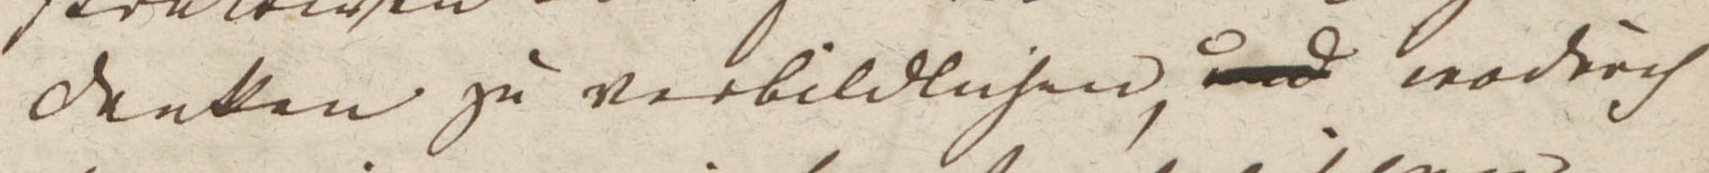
danken zu verbildlichen, und wodurch
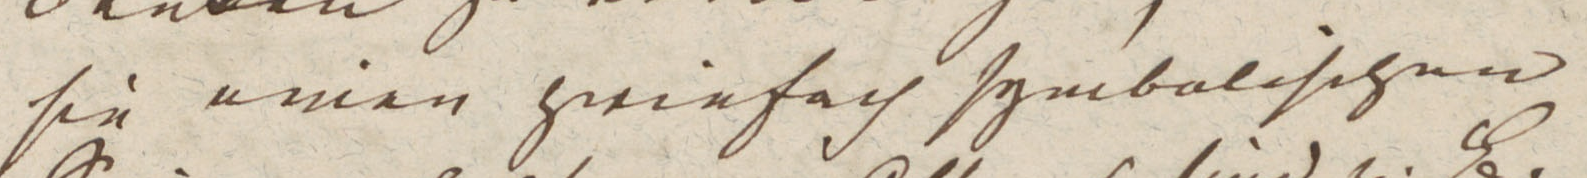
sie einen zwiefach symbolischen
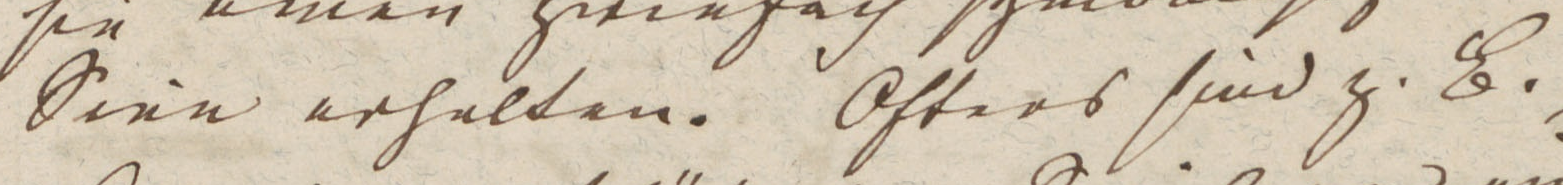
Sinn erhalten. Ofters sind z. B.
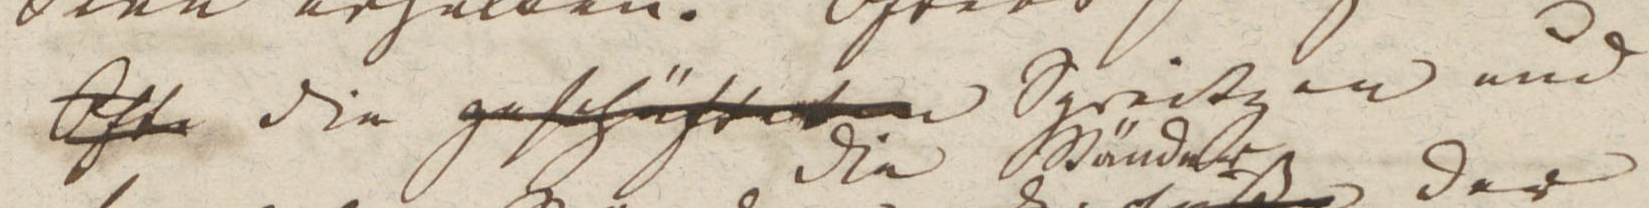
Ofte die geschäfteten Spreitzen und
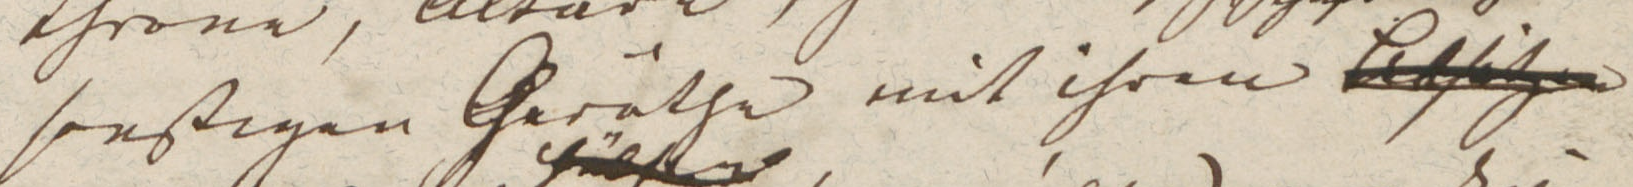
sonstigen Geräthe mit ihren Absätzen
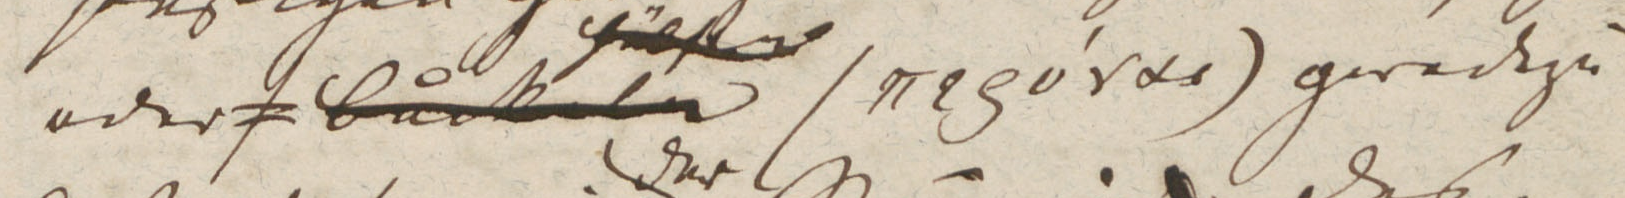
oder % Buckeln Hülsen (περύνα) geradezu
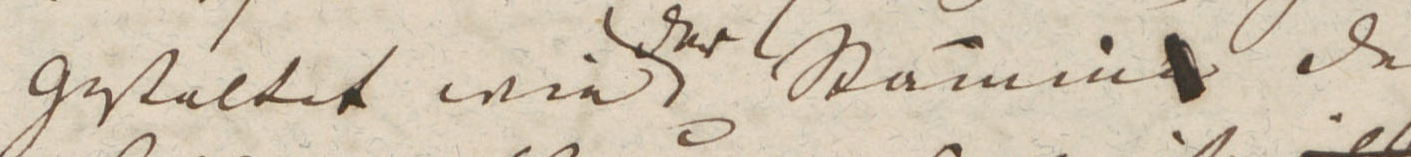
gestaltet wie der Stäamme des
